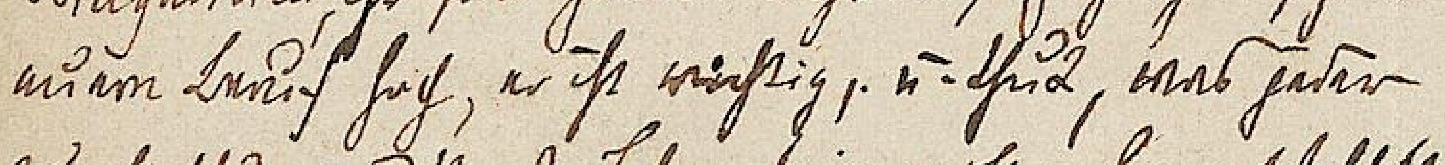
euern Beruf hoch, er ist richtig, u. thut, was jeder
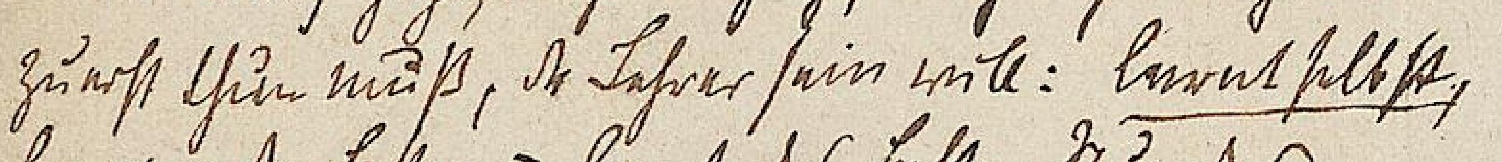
zuerst tun muß, der Lehrer sein will: lernt selbst,
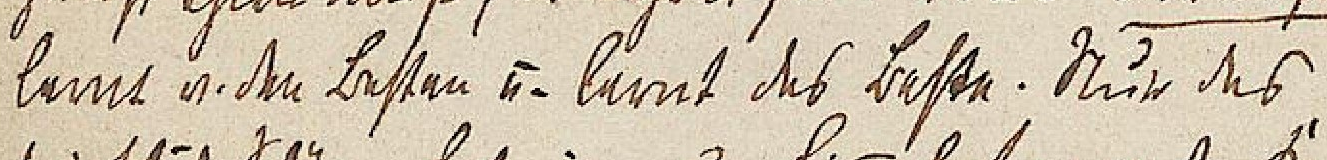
lernt v. den Besten u. lernt das Beste. Nur das
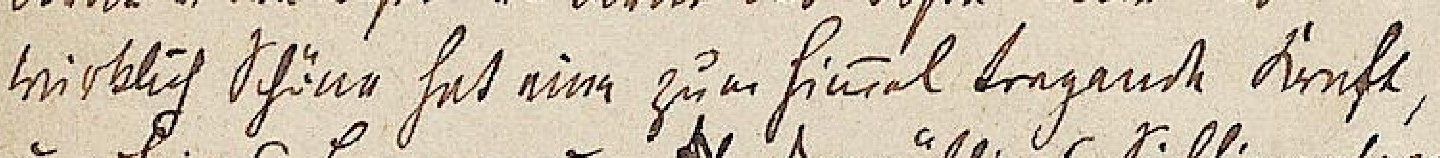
wirklich Schöne hat eine zum Himmel tragende Kraft,
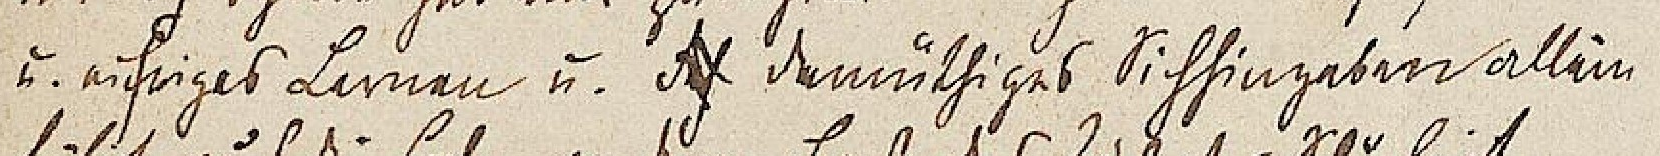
u. eifriges Lernen u. deh demüthiges Sichhingeben allein
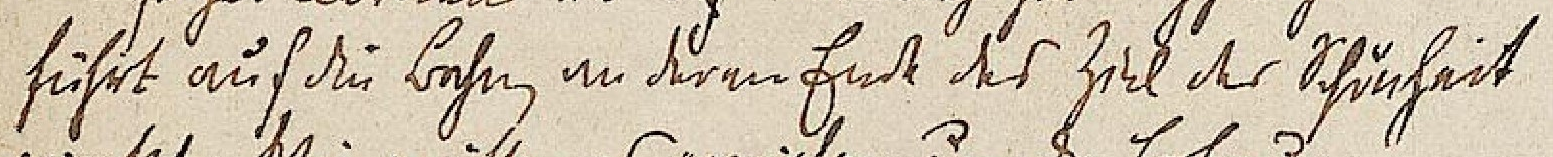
führt auf die Bahn, an deren Ende das Ziel der Schönheit
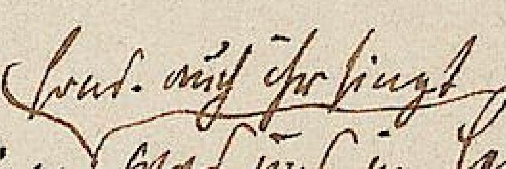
sond. auch ihr singt
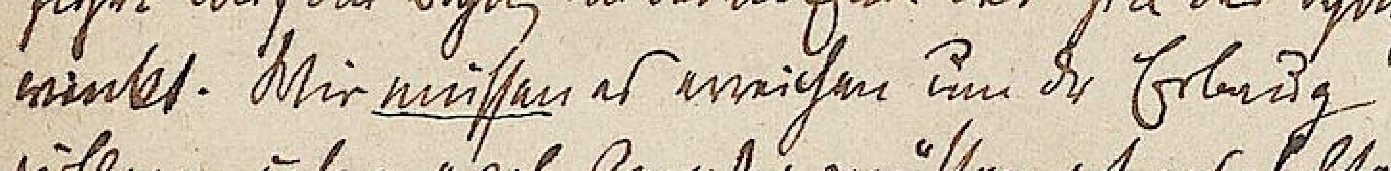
winkt. Wir müssen es erreichen um dr. Erbaug
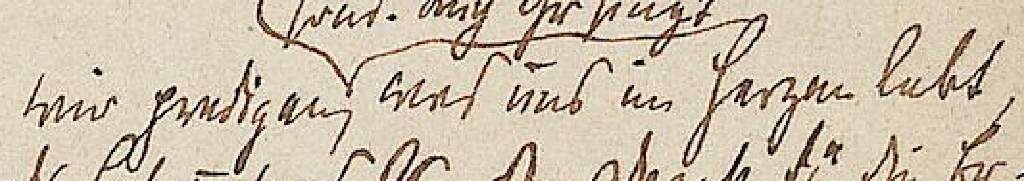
wir predigen, was uns im Herzen lebt
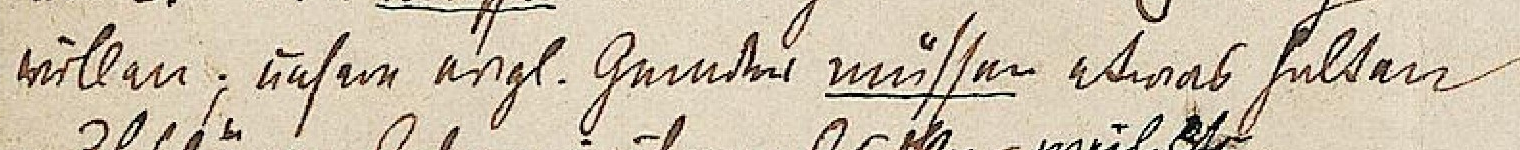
willen. unsere evgl. Gemden müssen etwas halten
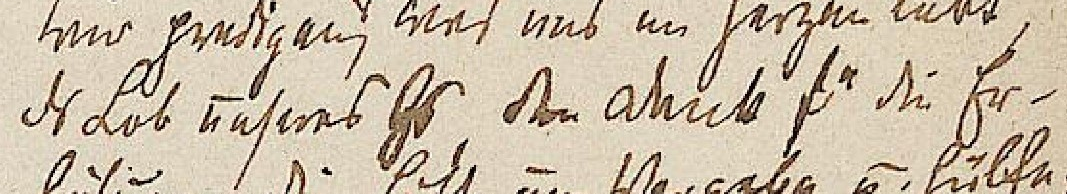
ds Lob unseres Gs, den Dank fü die Er¬
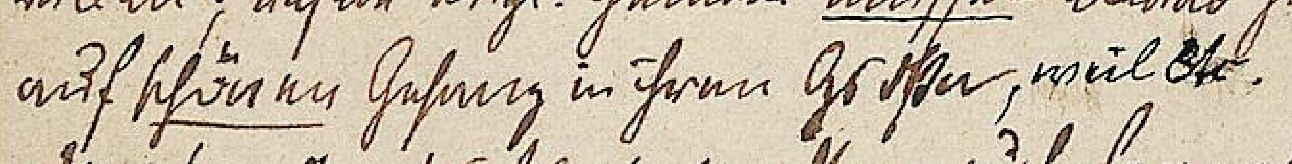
auf schönen Gesang in ihren Gsdstn, weil etc.
